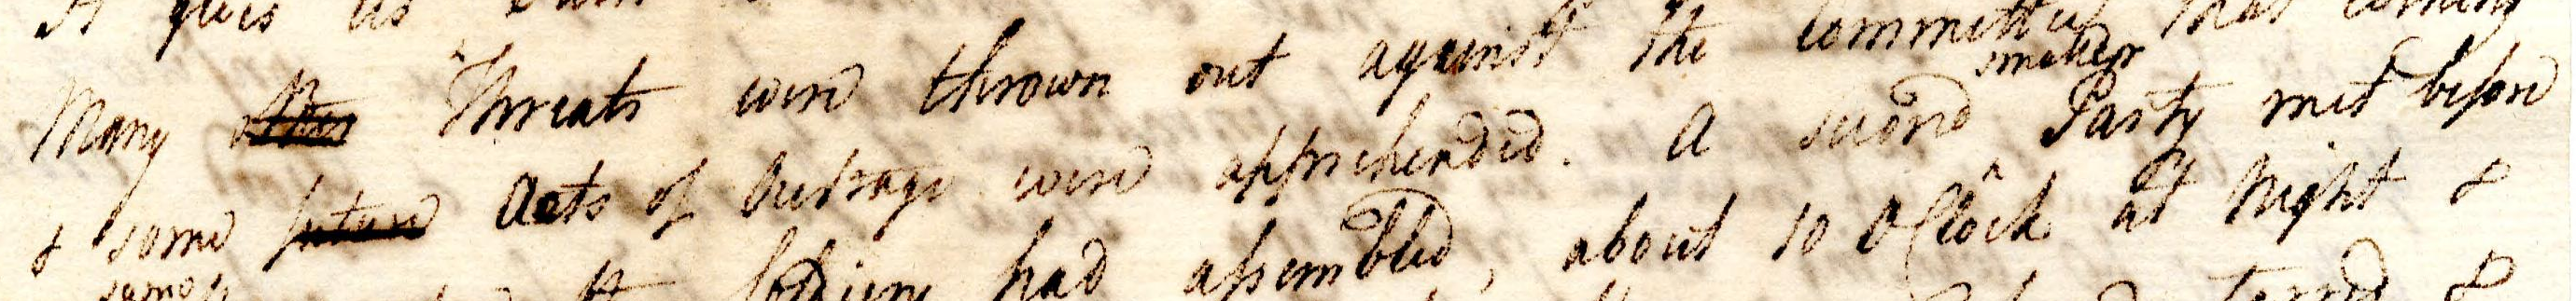& some future Acts of Outrage were apprehended. A second ^ Party met before
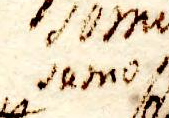same
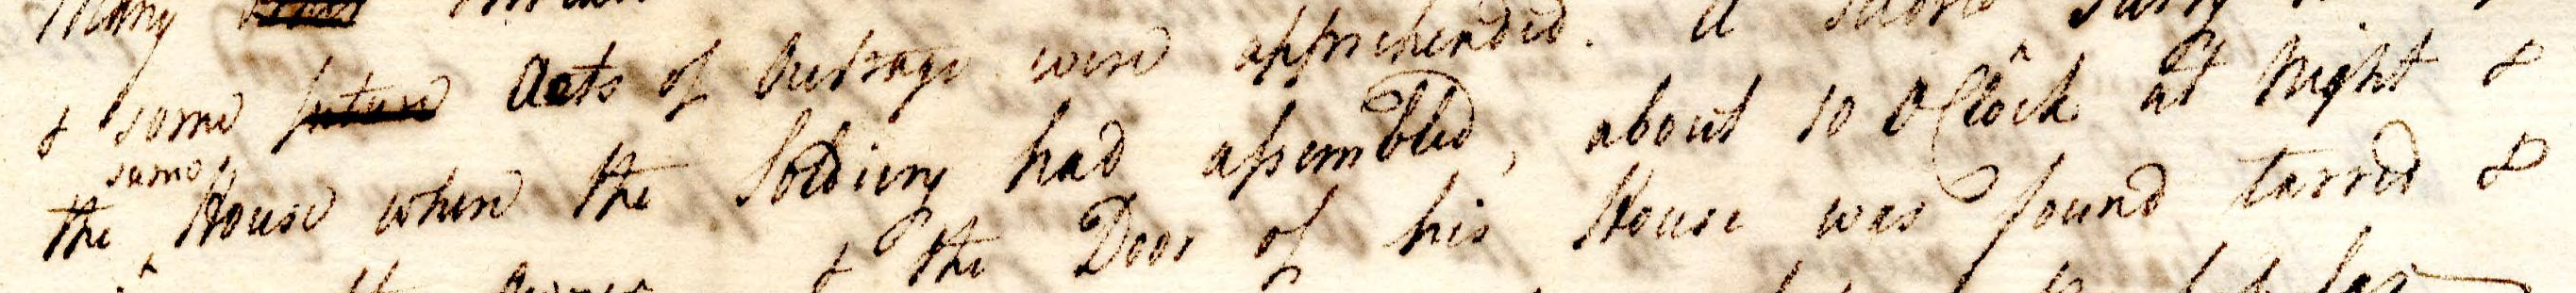the ^ House when the Soldiery had assembled, about 10 OClock at night &
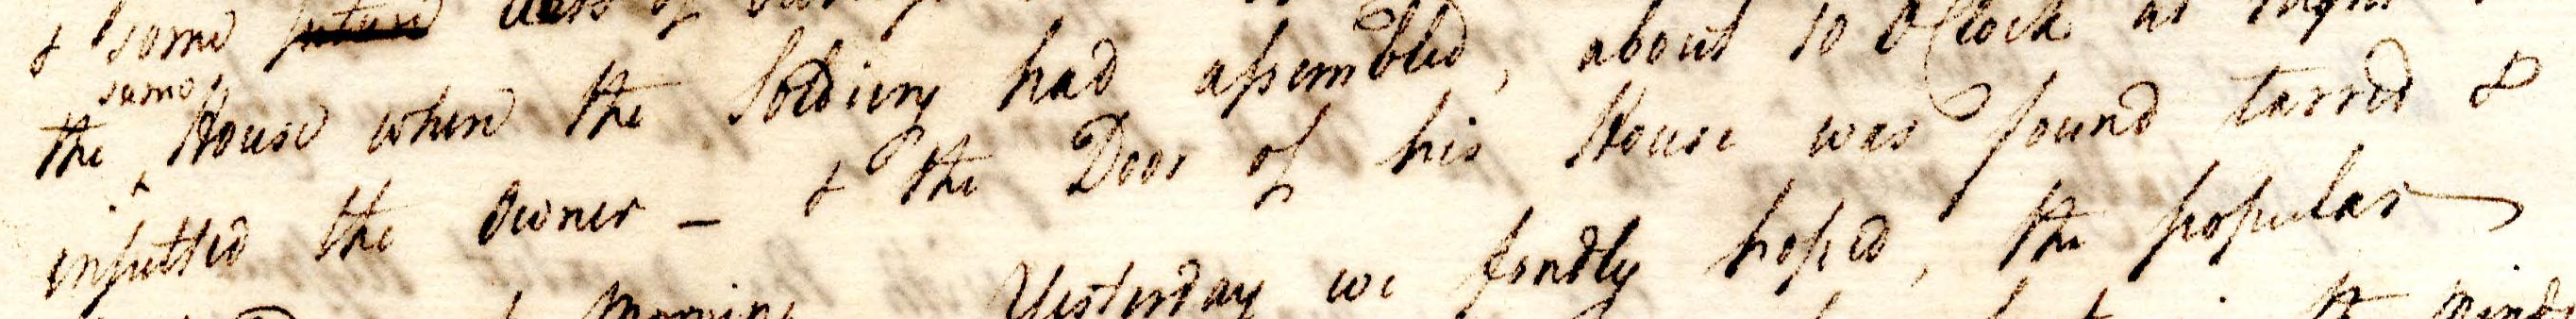insulted the owner, & the Door of his House was found tarred &
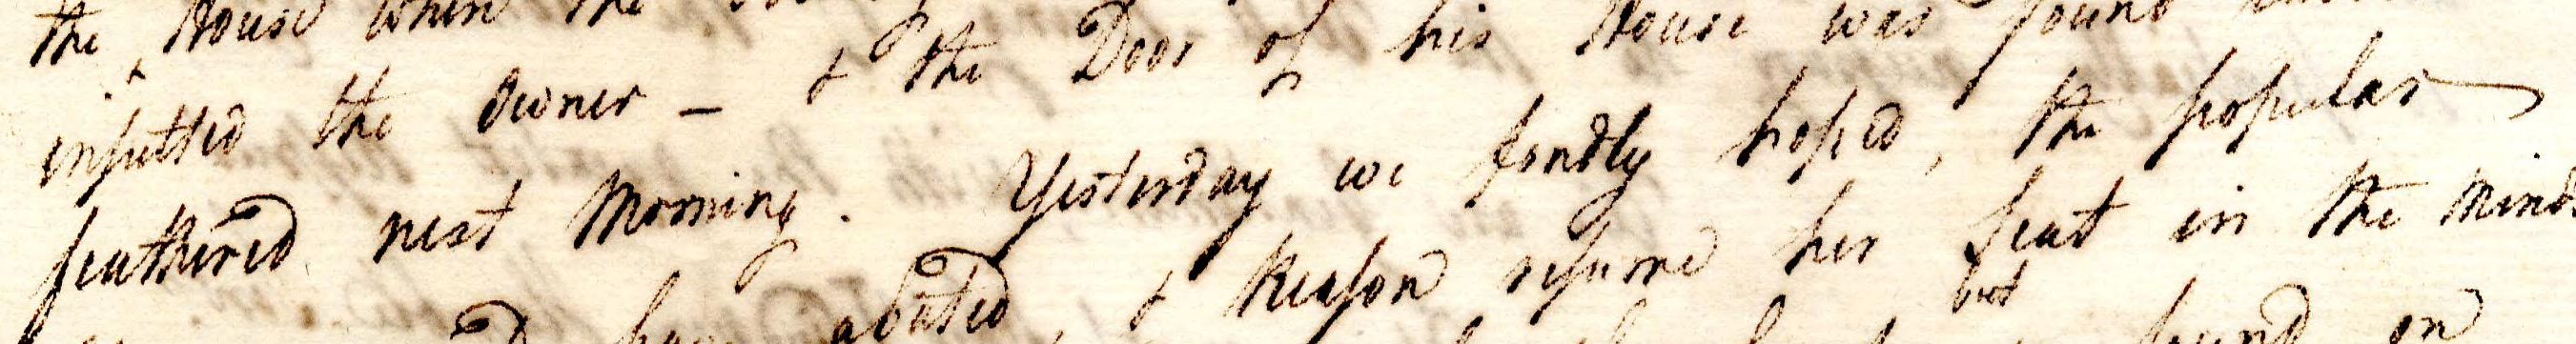feathered next Morning. Yesterday we fondly hoped the popular
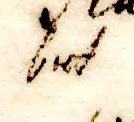but
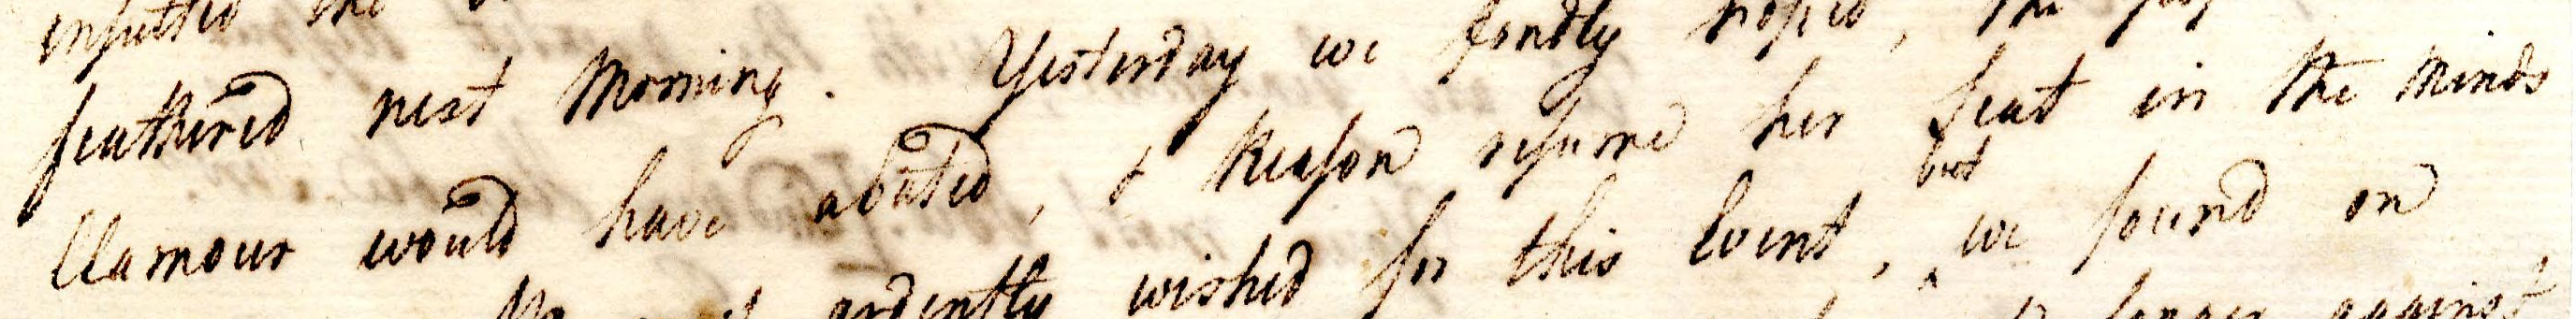Clamour would have abated, & Reason resume her seat in the Minds
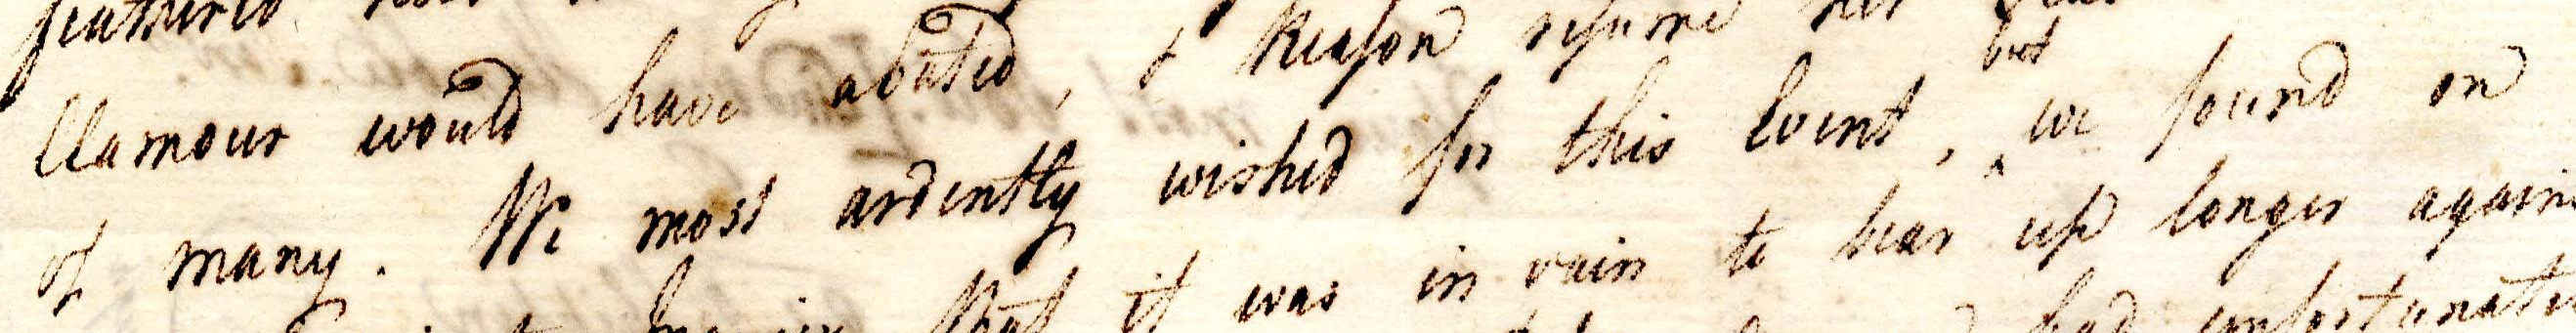of many. We most ardently wished for this event, ^ we found on
